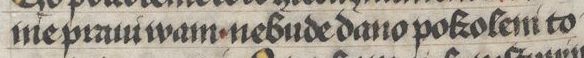ne praui wam.nebude dano pokolení to¬
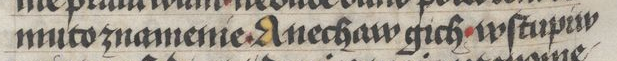muto znameníe. A nechaw gich.wſtupiw
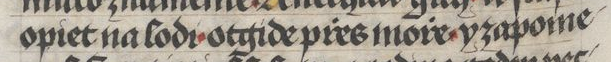opiet na lodi.otgíde pṙes moṙe.y zapome¬
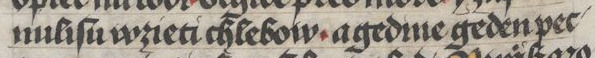nuliſu wzieti chlebow.a gedme geden pec¬
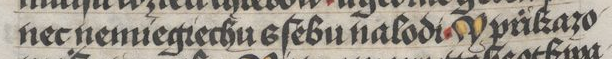nec nemegíechu sſebu nalodí.Y pṙikazo¬
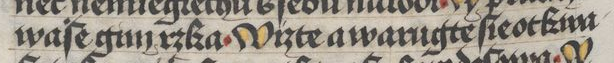waẛe gim rzka.Vizte a varugte ſie ot kwa¬
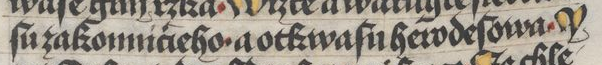ſu zakonniċieho.a ot kwaſu herodeſowa.Y
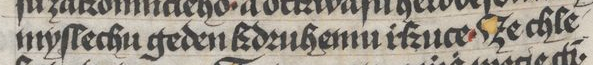myſlechu geden k druhemu ṙkuce.Ze chle¬
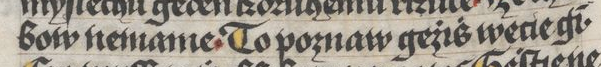bow nemame.To poznaw geżiṡ wecie gī
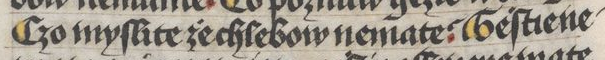Czo myſlite że chlebow nemate?Geẛtie ne¬
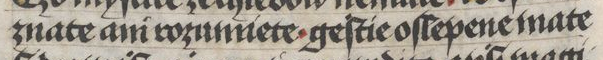znat ani rozumiete.geẛtie oſlepene mate
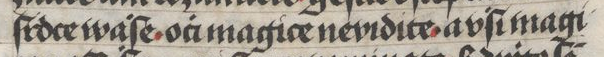ſrdce waẛe.oċi magice nevidite.a vẛi magí¬
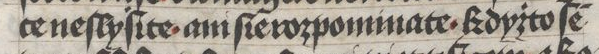ce neſlyẛite.ani ſie rozpomimate.kdyżto ſē
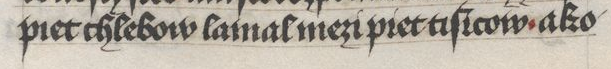piet chlebow lamal mezi píet tiſicow.ako¬
